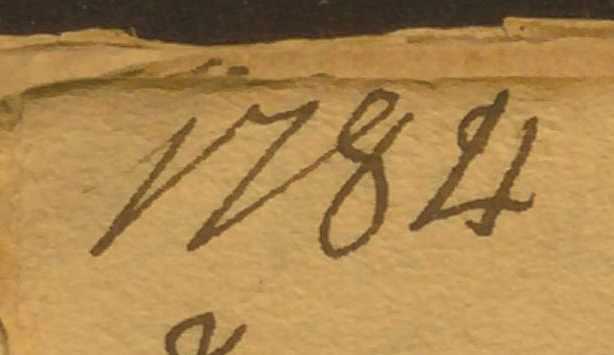1784
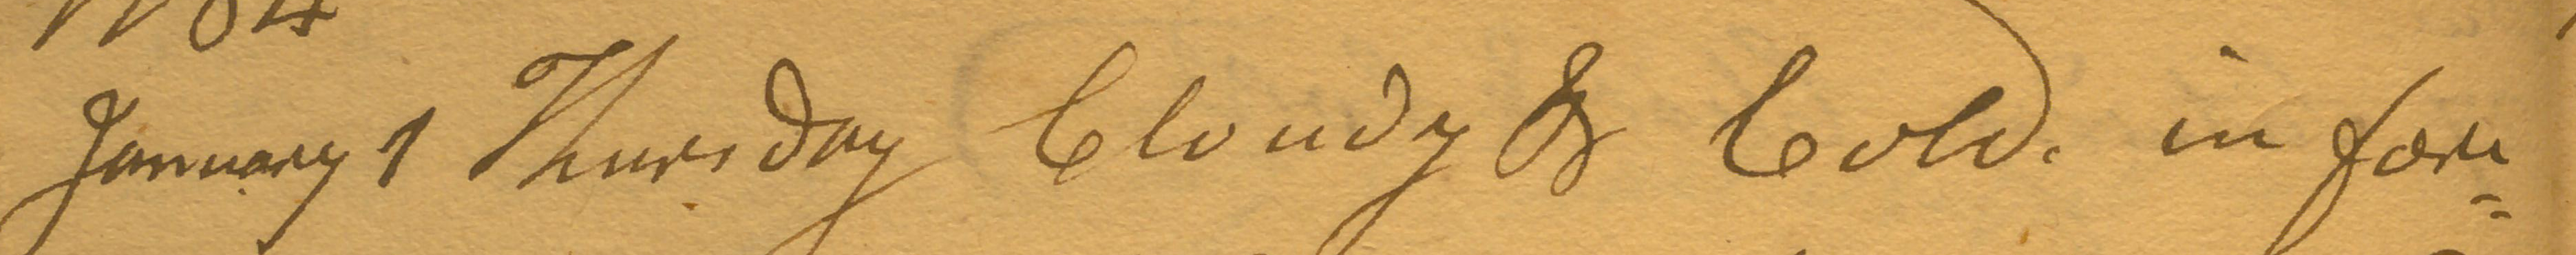January 1 Thursday Cloudy & Cold. in fore
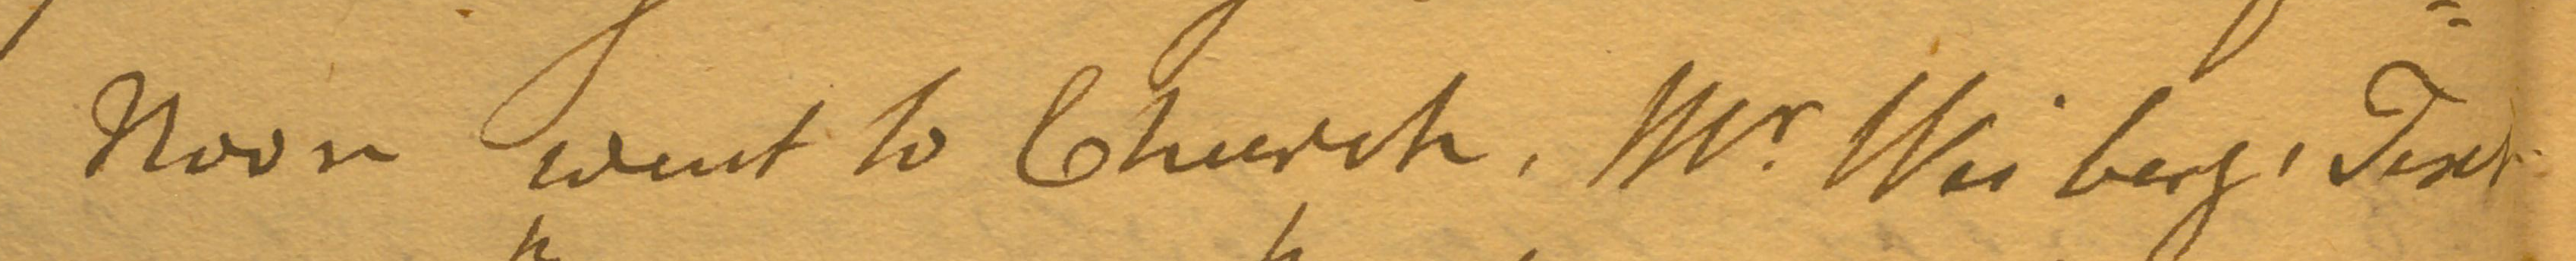Noon went to Church, M^r. Weibergs Text
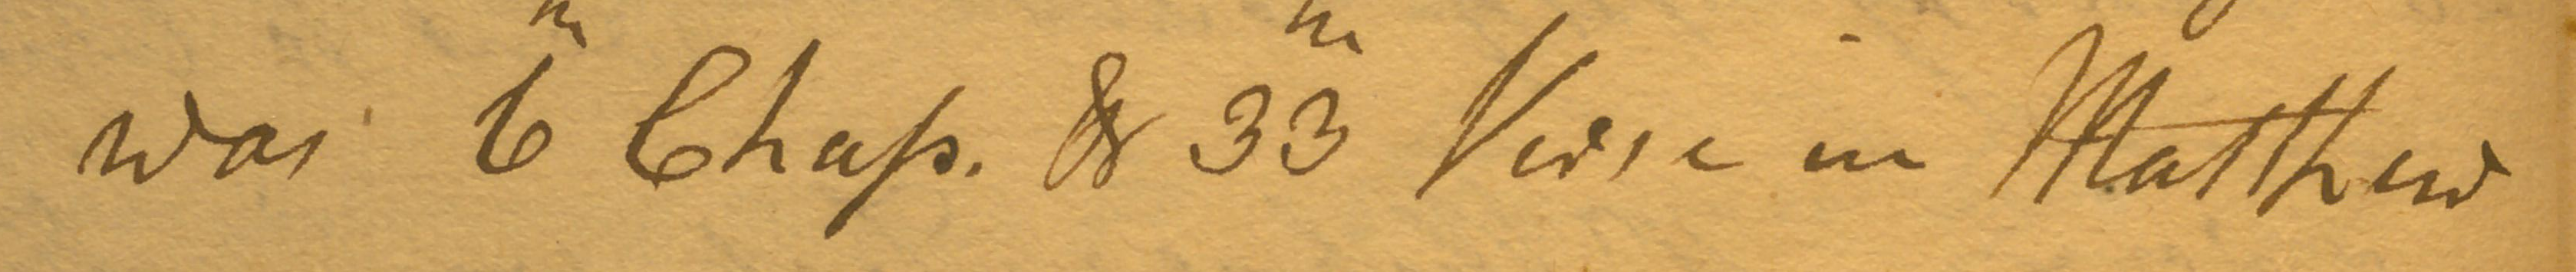was 6^th Chap. & 33^h Verse in Matthew
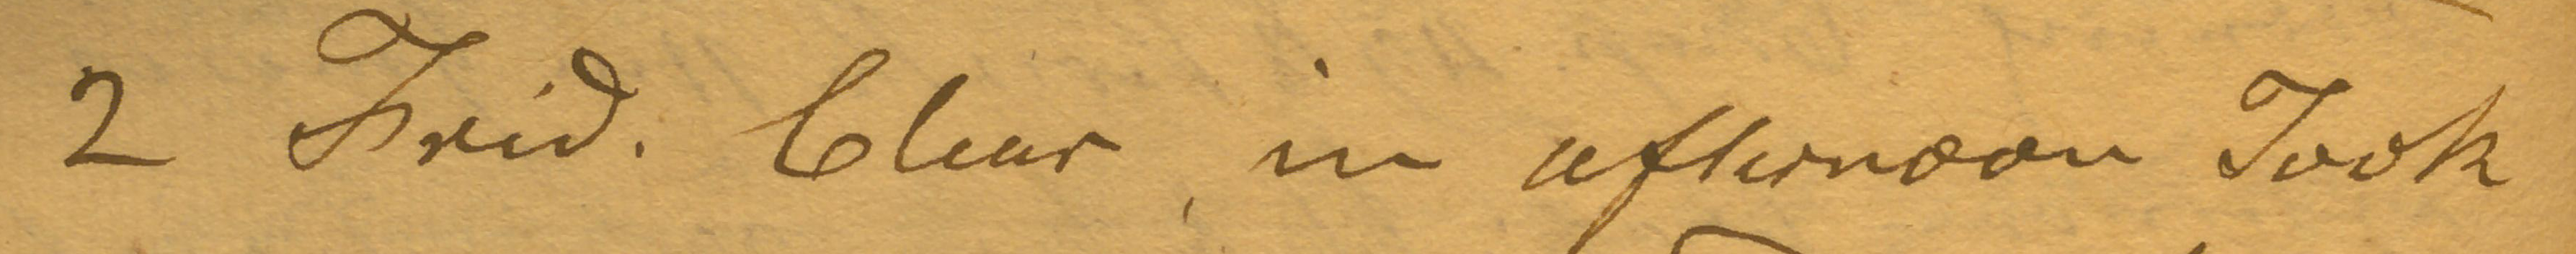2 Frid. Clear in afternoon Took
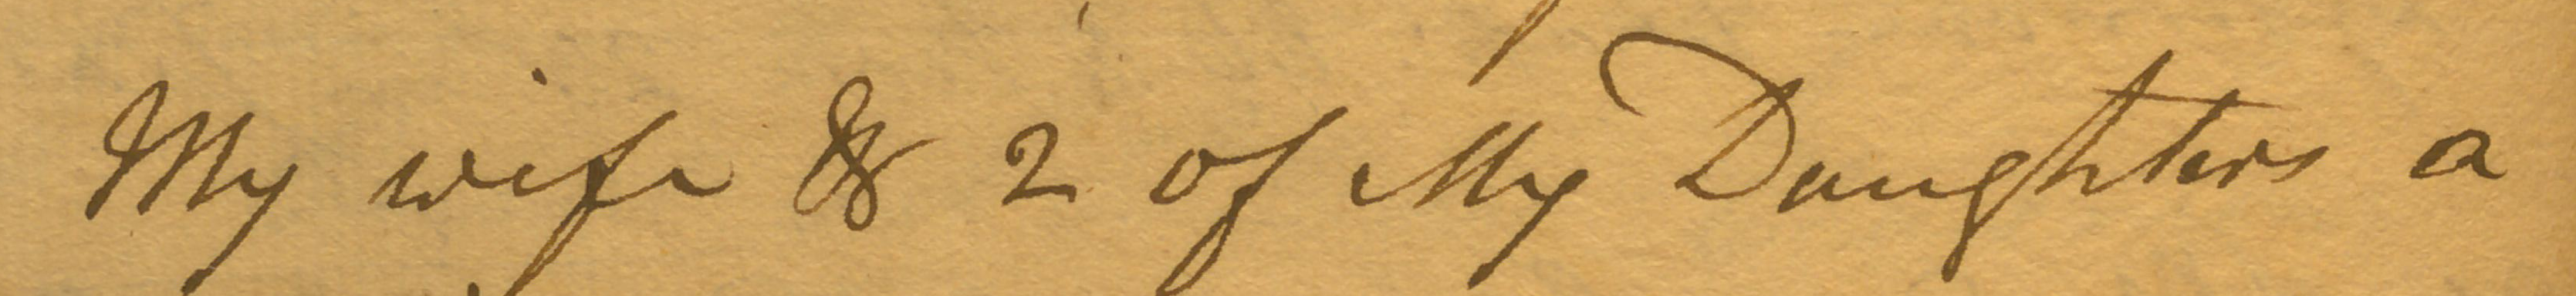My wife & 2 of My Daughters a
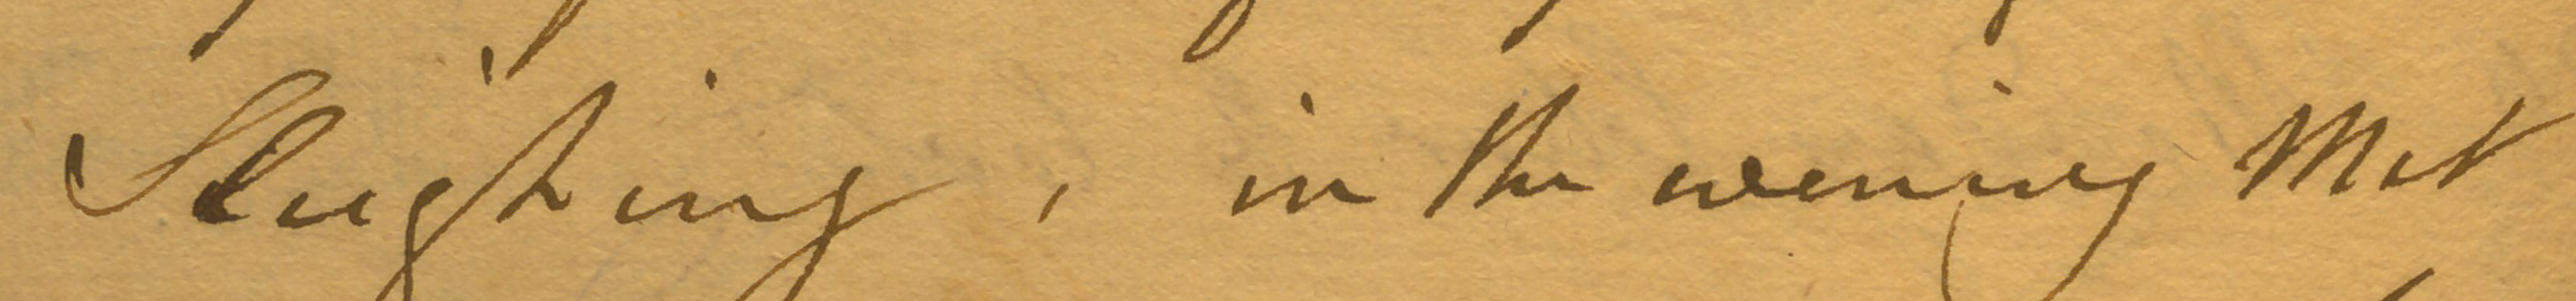Sleighing, in the evening Met
